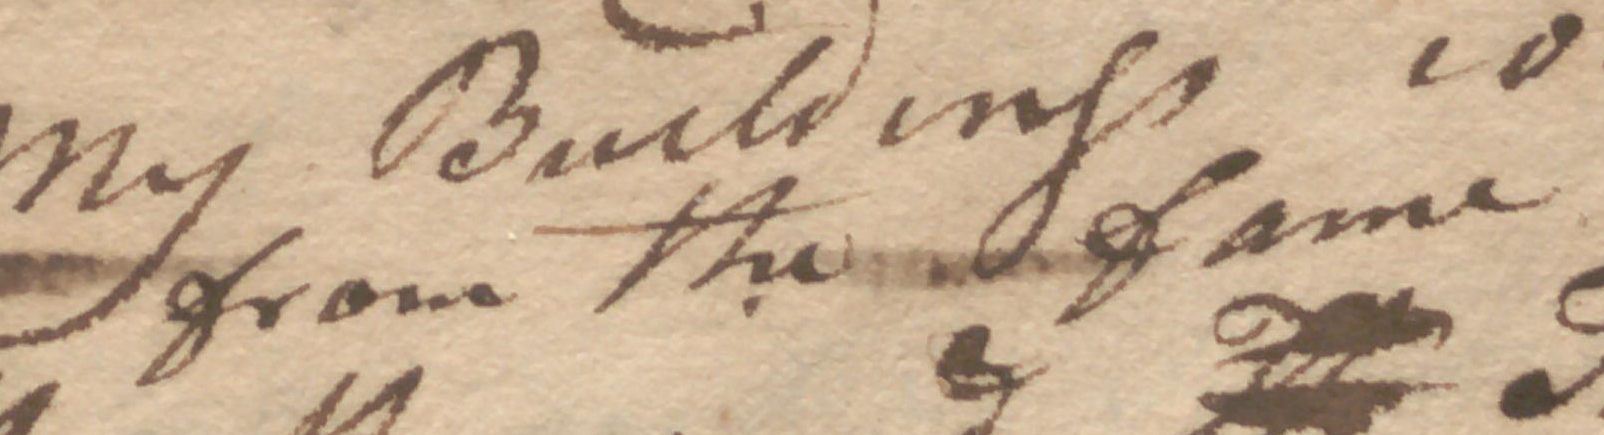from the fame
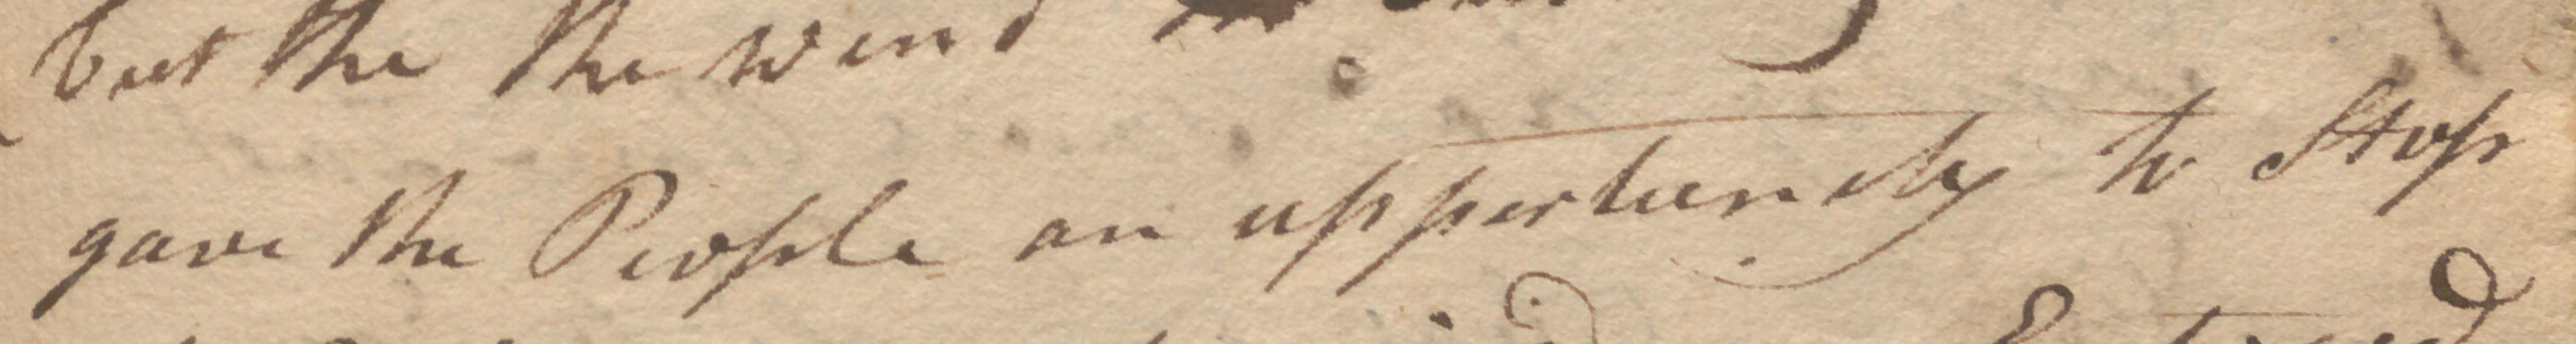gave the People an uppertunety to stop
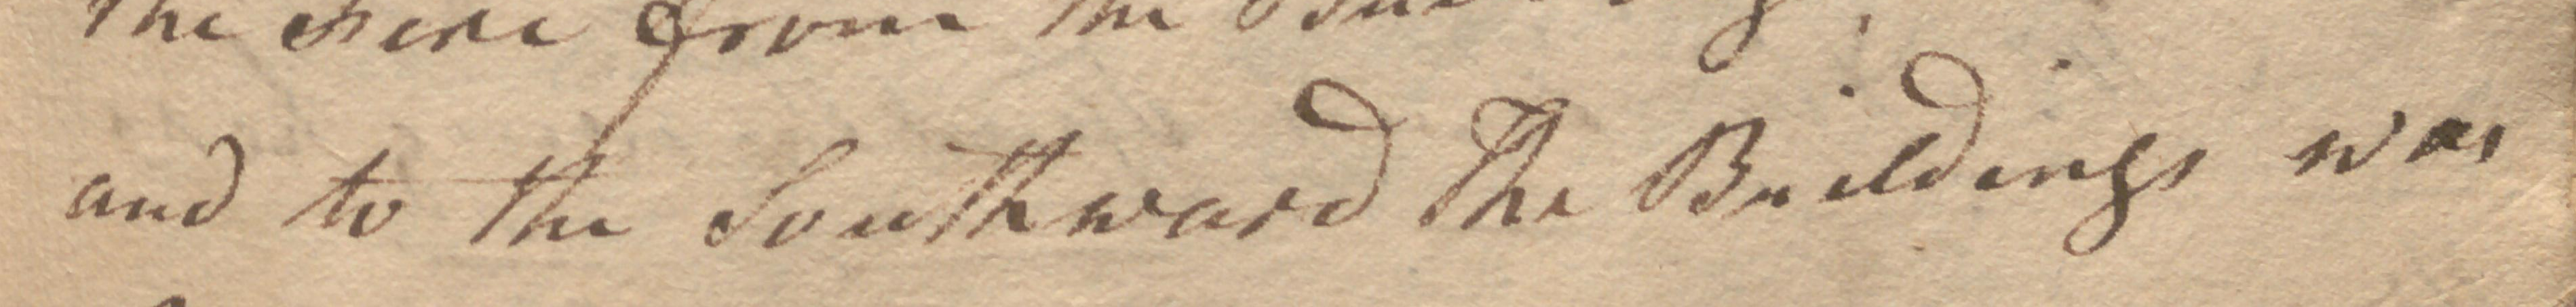and to the Southward the Breldings was
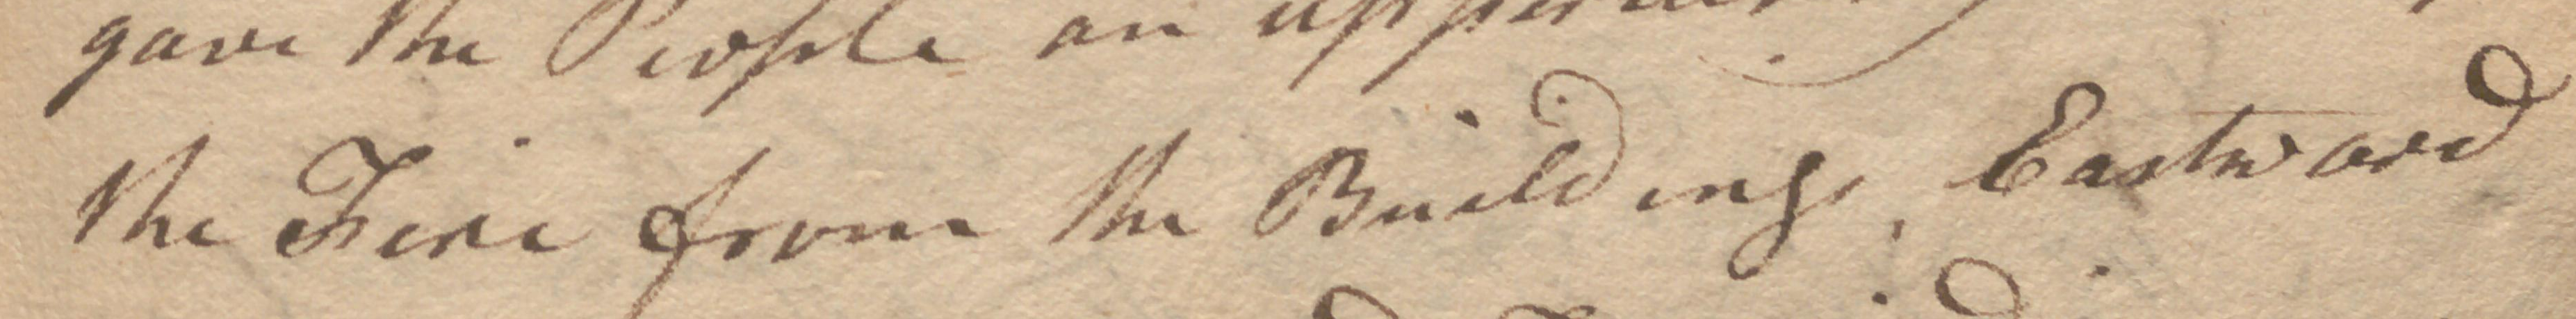the Fire from the Building Eastward
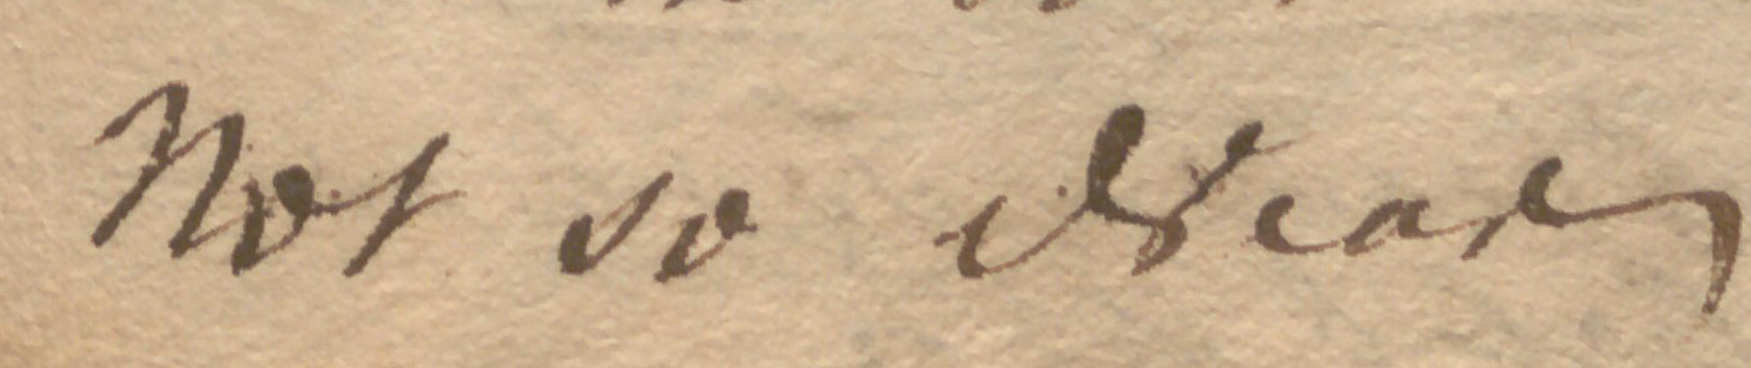Not so Near
